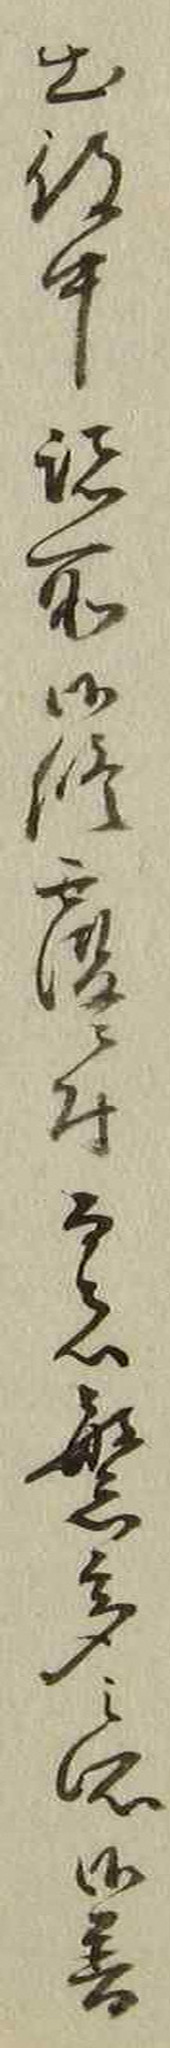出役中諸所御修復ニ付而者繁多之所御普
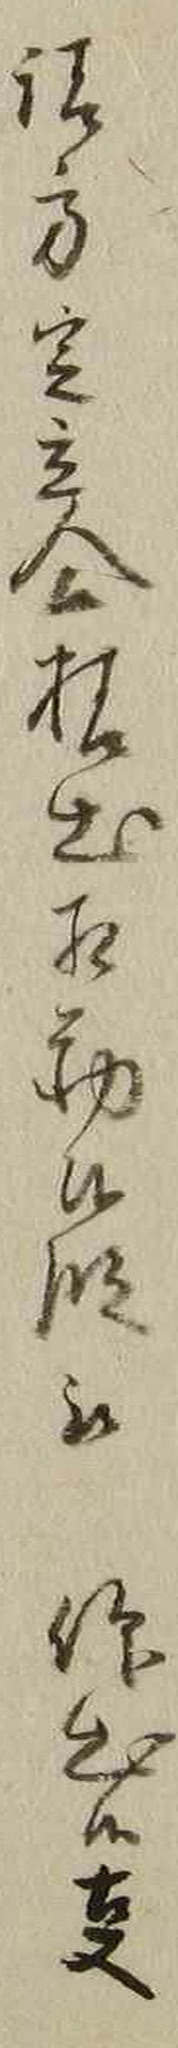請方定立合精出相勤候段被仰出候事
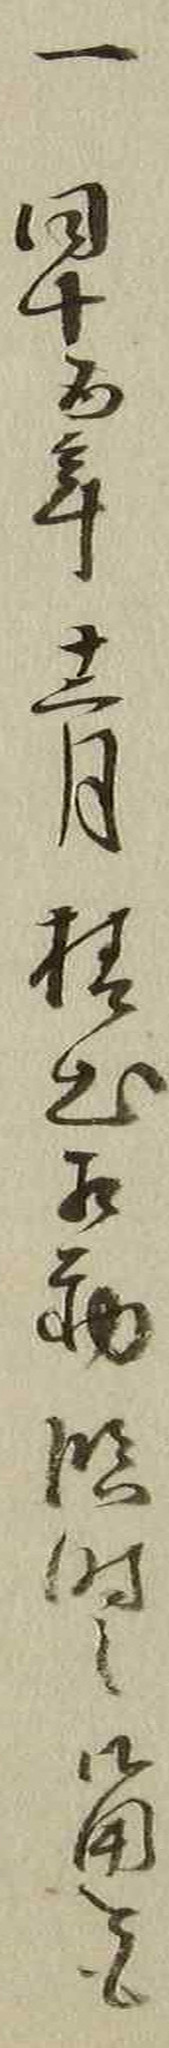一同十酉年十二月精出相勤臨時之御用をも
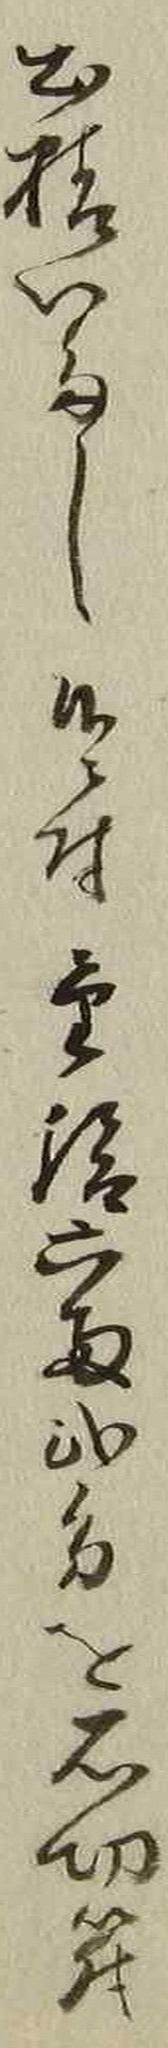出精いたし候ニ付金拾六両弐分を石切符
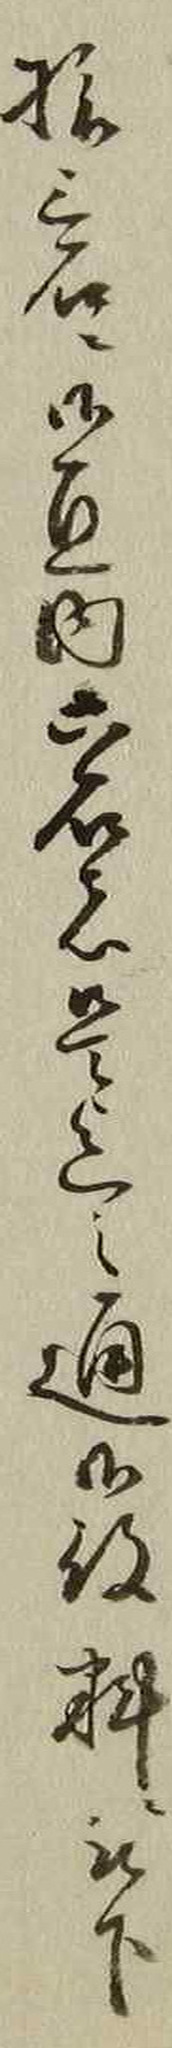拾三石ニ御直内六石者是迄之通御役料ニ被下
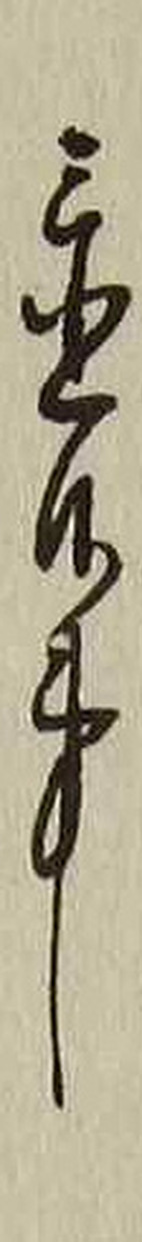置候事
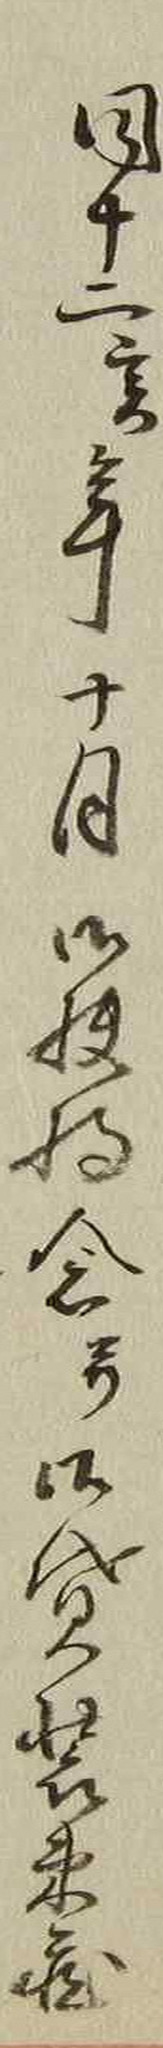一同十二亥年十月御扶持倉并御貸装束蔵
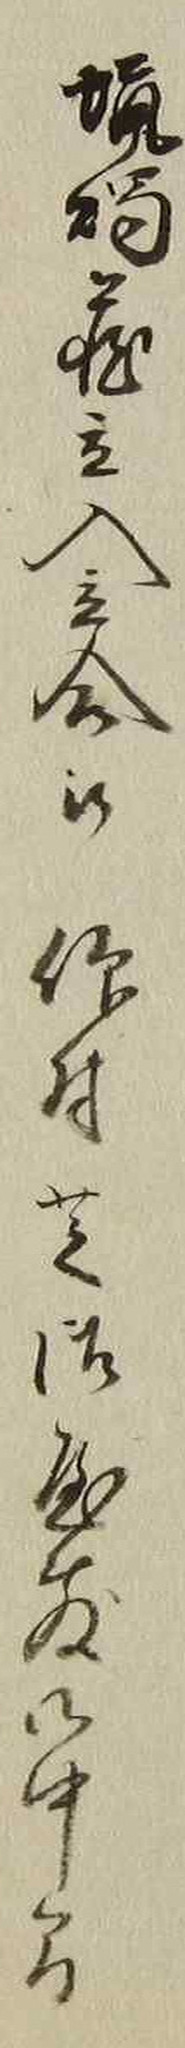蝋燭蔵立入立合被仰付芝御屋敷御中間
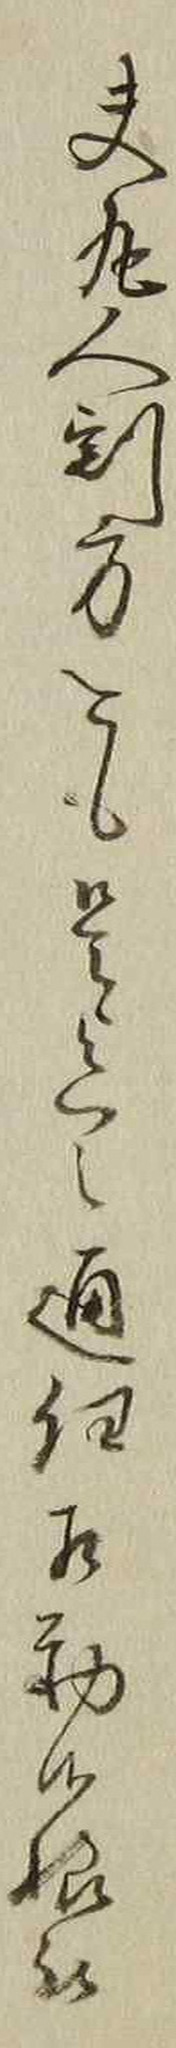夫丸人割方をも是迄之通任相勤候様被
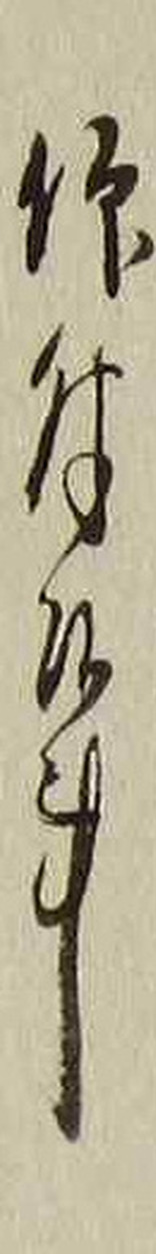仰付候事
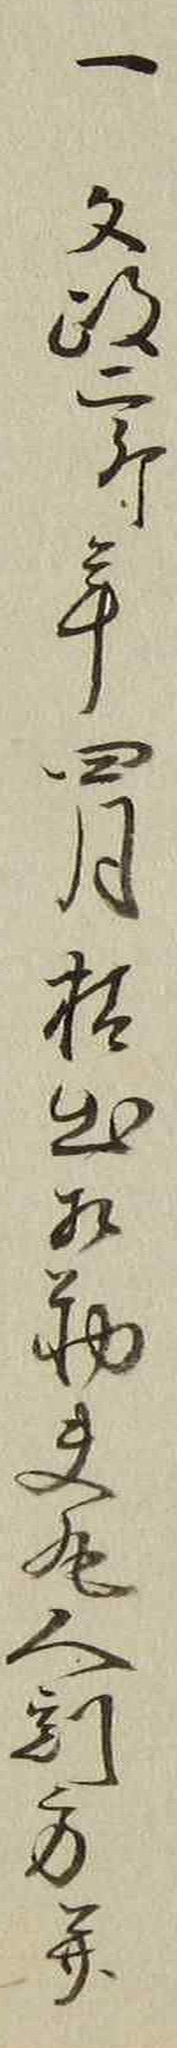一文政二卯年四月精出相勤夫丸人割方并
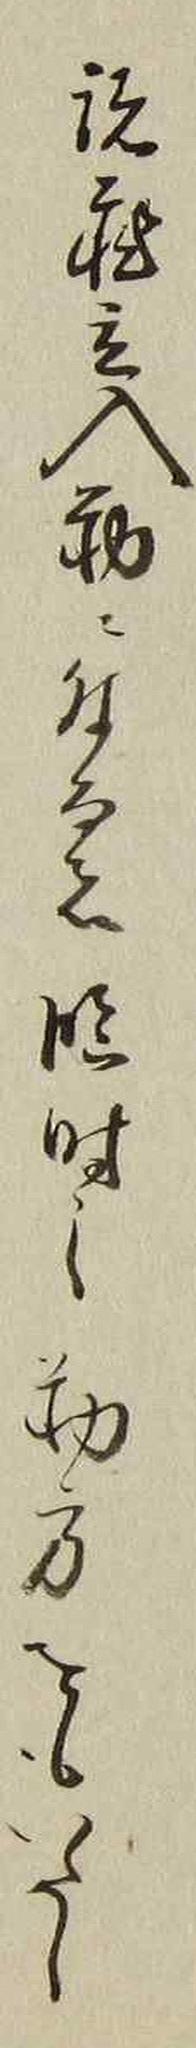諸蔵立入勤ニ付而者臨時之勤方をもいたし
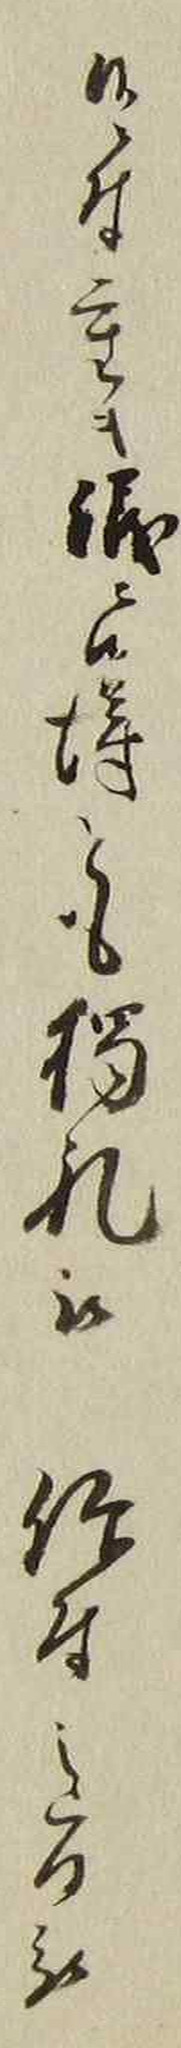候ニ付重キ儀ニ候得とも独礼被仰付之旨被
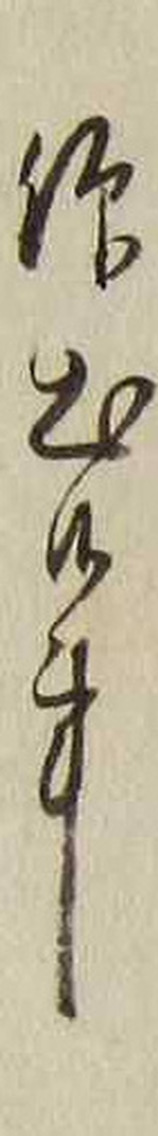仰出候事
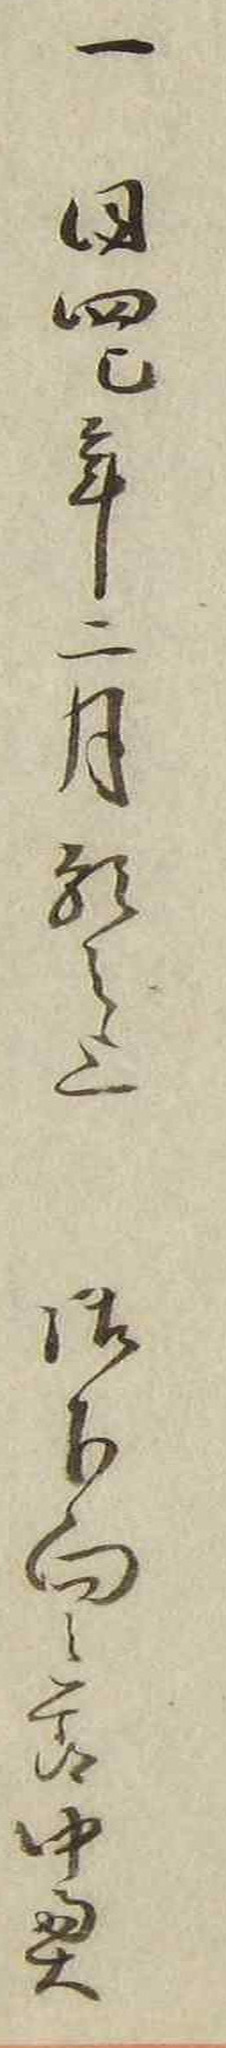一同四巳年二月願之上御下向之節中奥

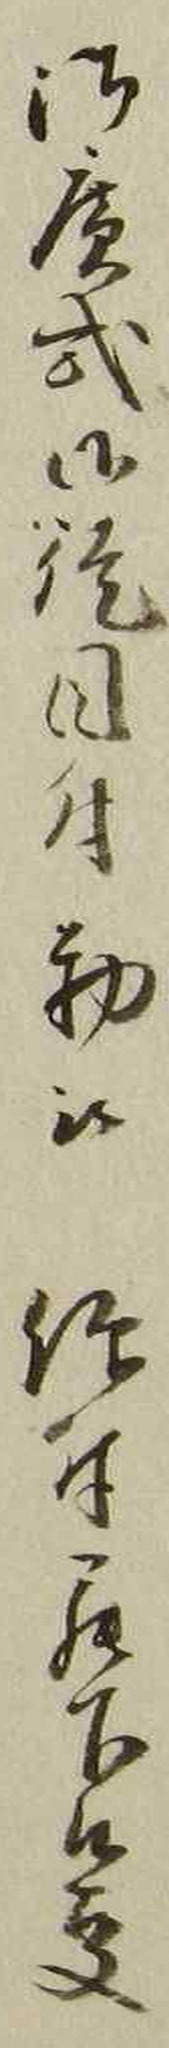御広敷御徒目付勤被仰付罷下候事
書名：諸士系譜　巻之132　た之部8
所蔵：会津若松市立会津図書館
